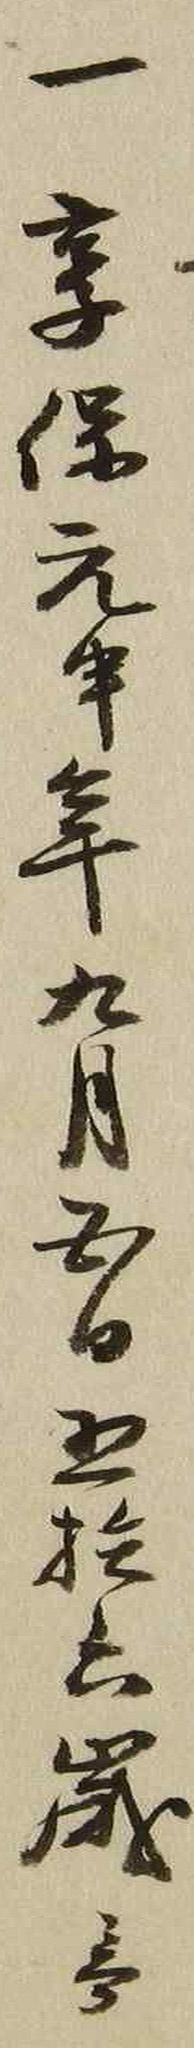一享保元申年九月五日五拾六歳に而
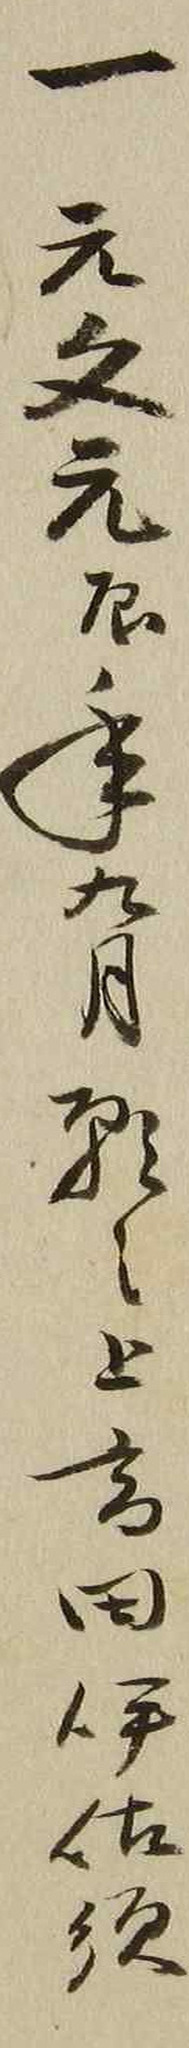一元文元辰年九月願之上髙田伊佐須
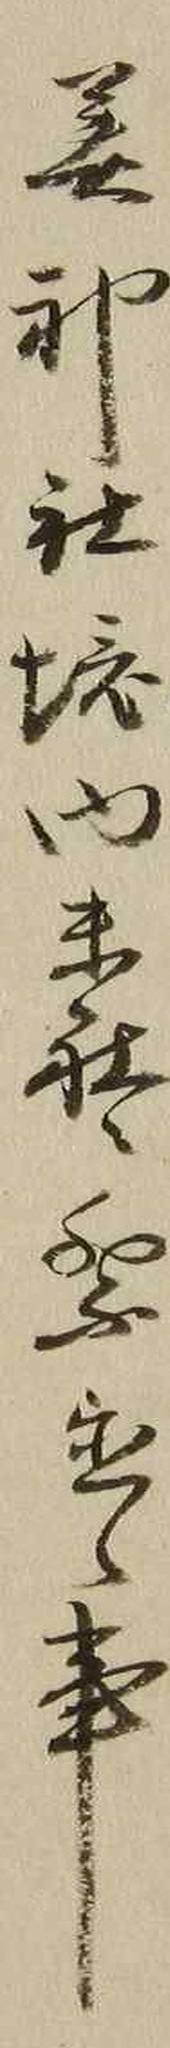美神社境内末社へ祭置候事
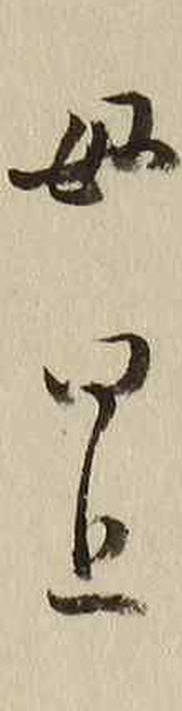母同上
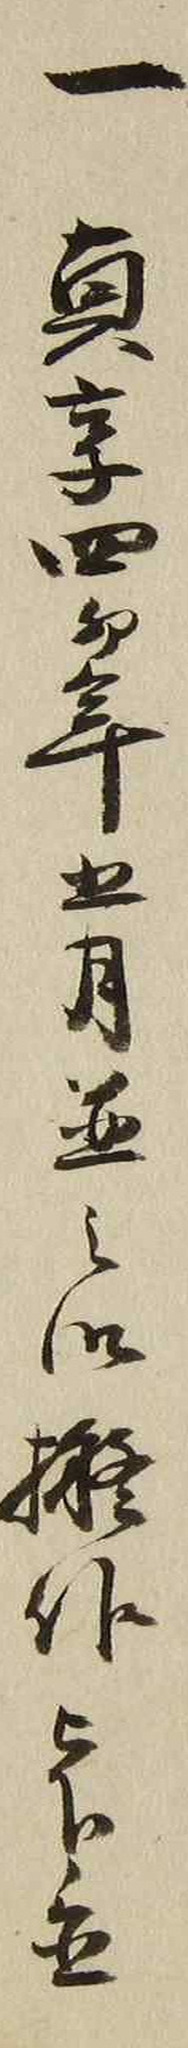一貞享四卯年五月並之御擬作被下置
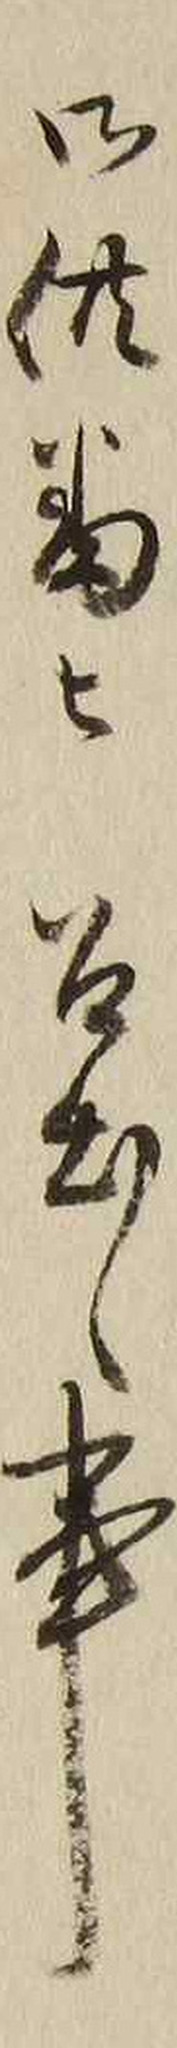御供番被召出候事
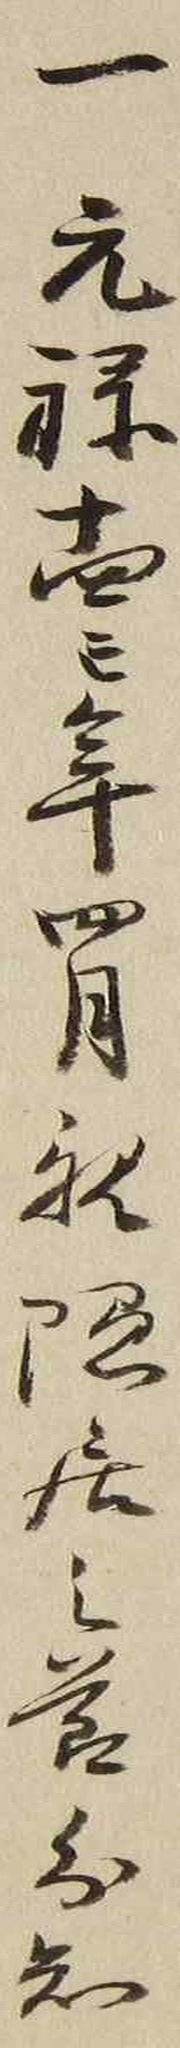一元禄十四巳年四月親隠居之節分知
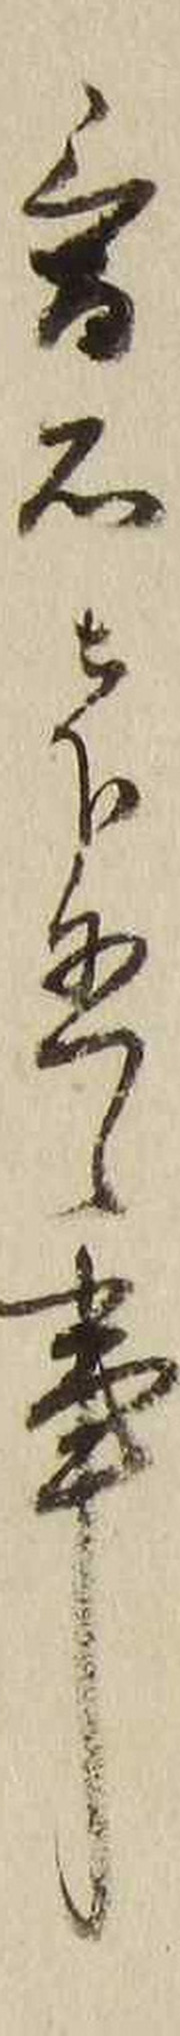三百石被下置候事

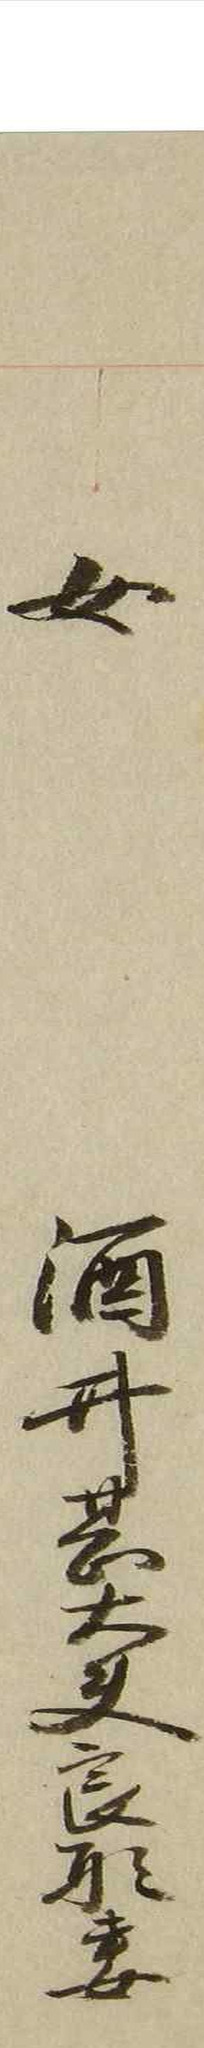女酒井甚太夫良聆妻
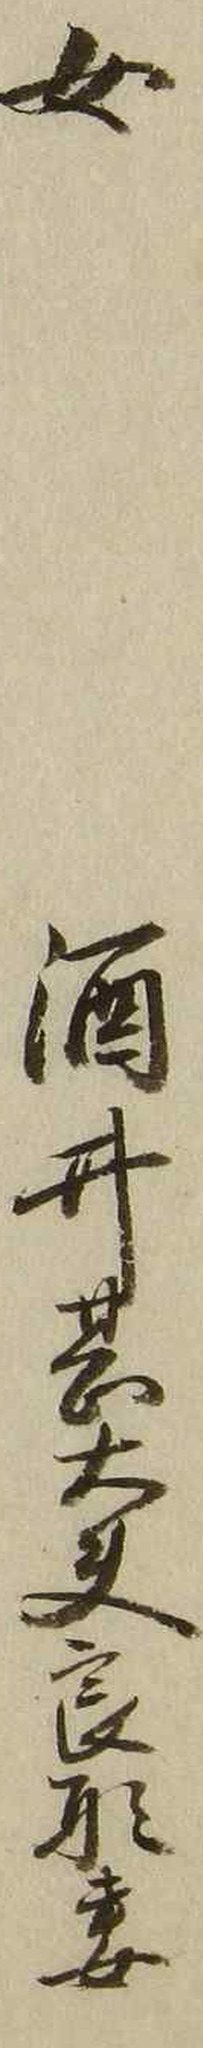女酒井甚太夫良聆妻
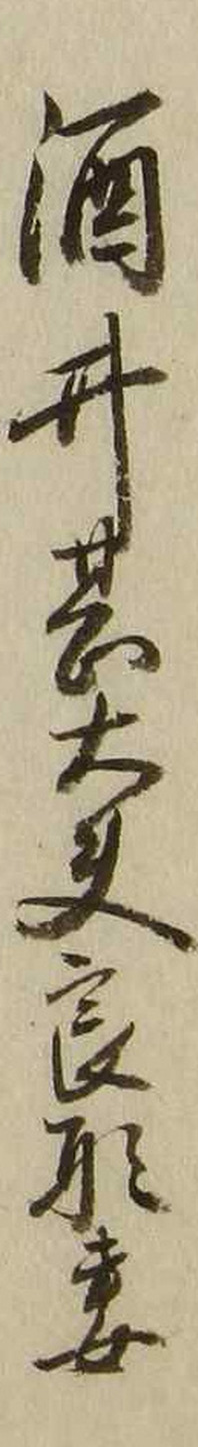女酒井甚太夫良聆妻
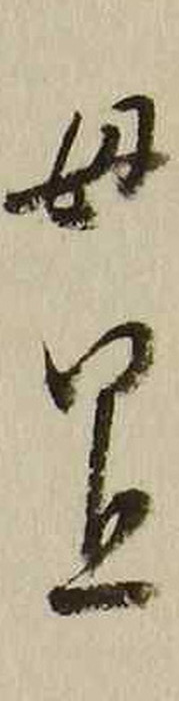母同上
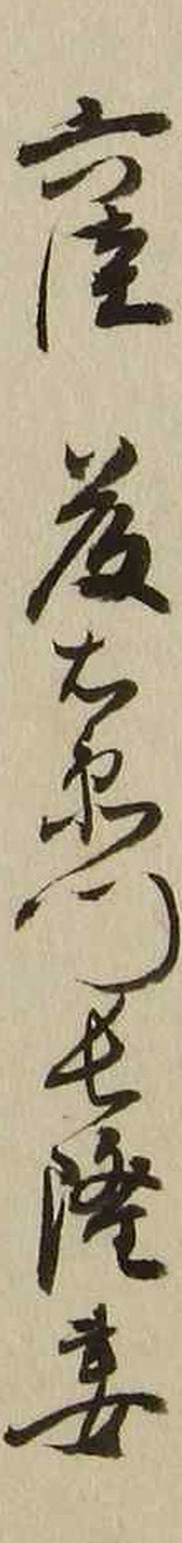女窪藤右衛門長隆妻
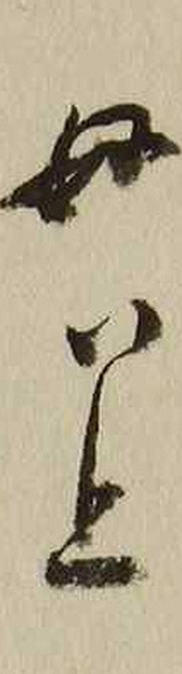母同上
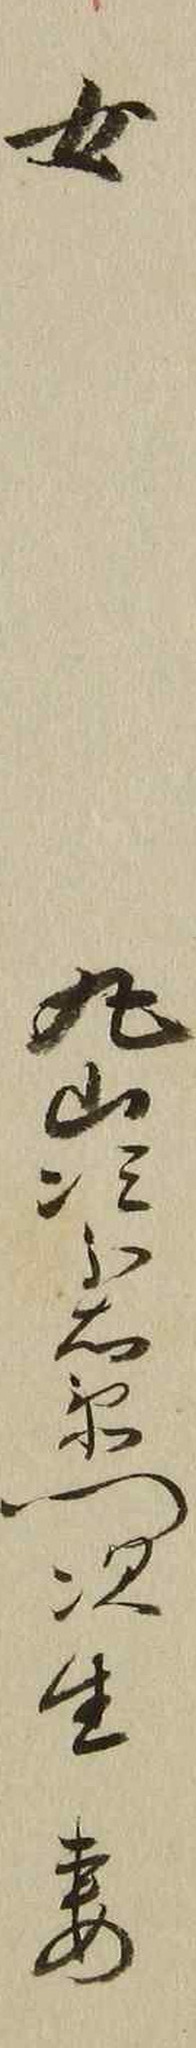女丸山次郎右衛門次生妻
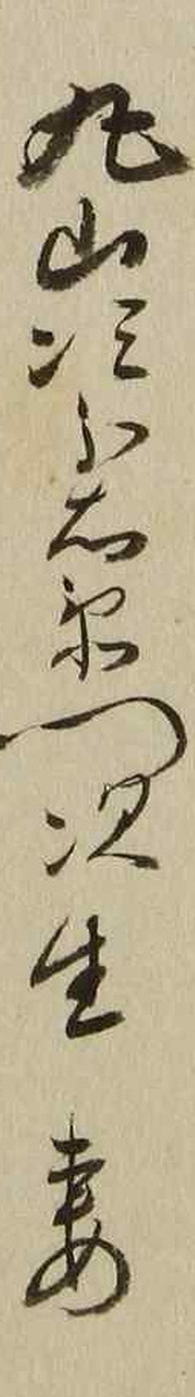女丸山次郎右衛門次生妻
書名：諸士系譜　巻之269　さ之部1
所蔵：会津若松市立会津図書館
